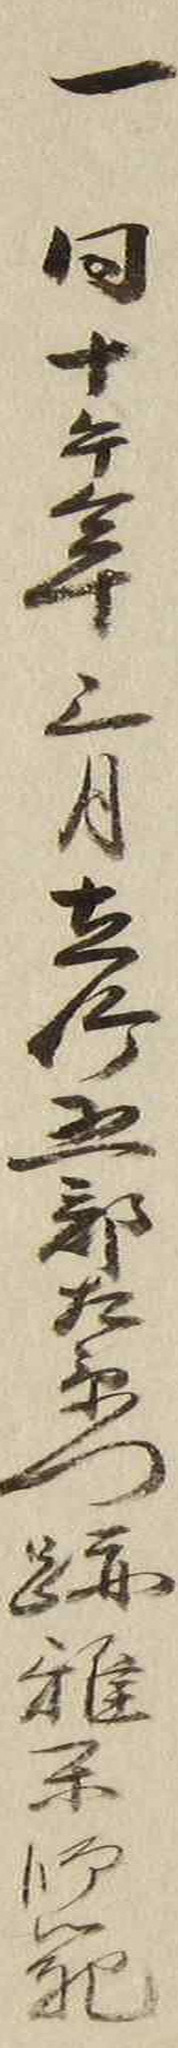一同十午年三月在竹五郎左衛門跡雅楽師範
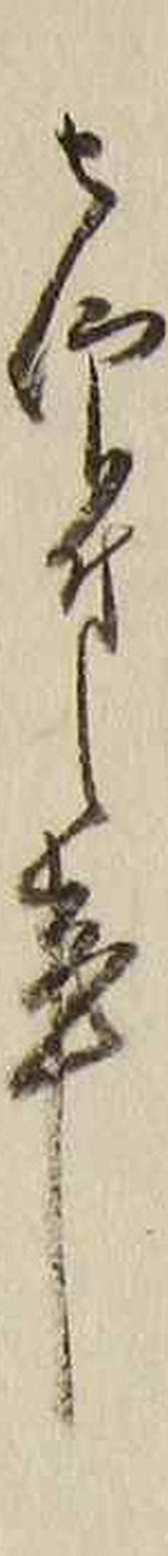被仰付候事
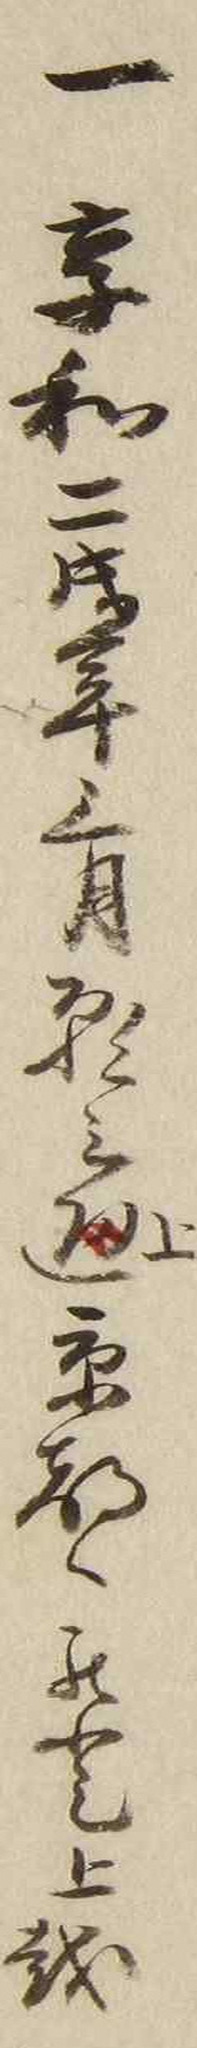一享和二戌年三月、願之通京都へ罷登上越
